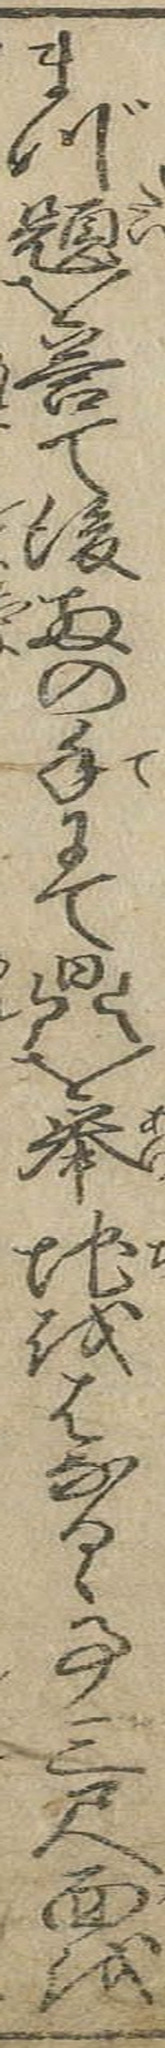まづ題を答て後両の手にて鼎を挙地をはなるゝ事三尺面を
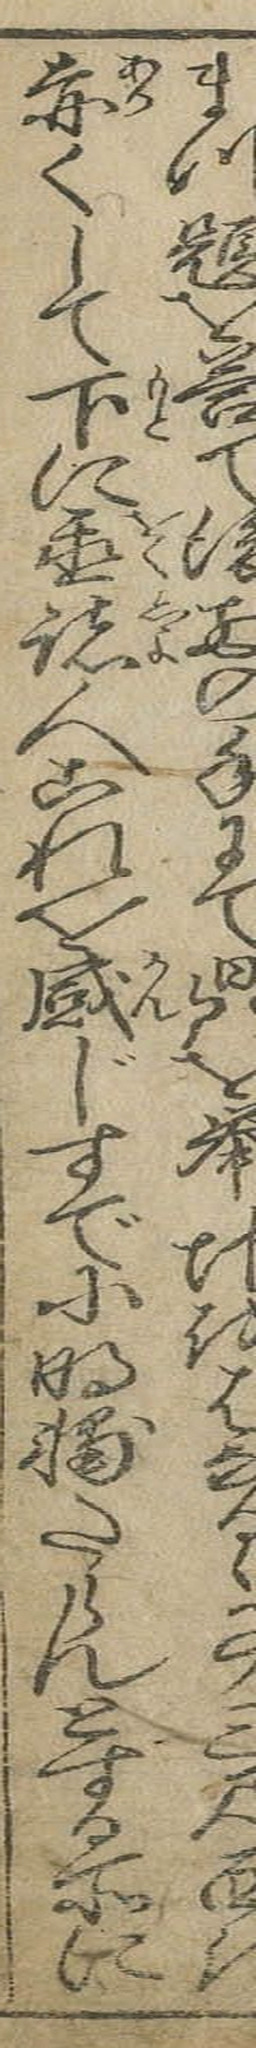赤くして下に置諸人これを感じすでに明輔たらんとする所に

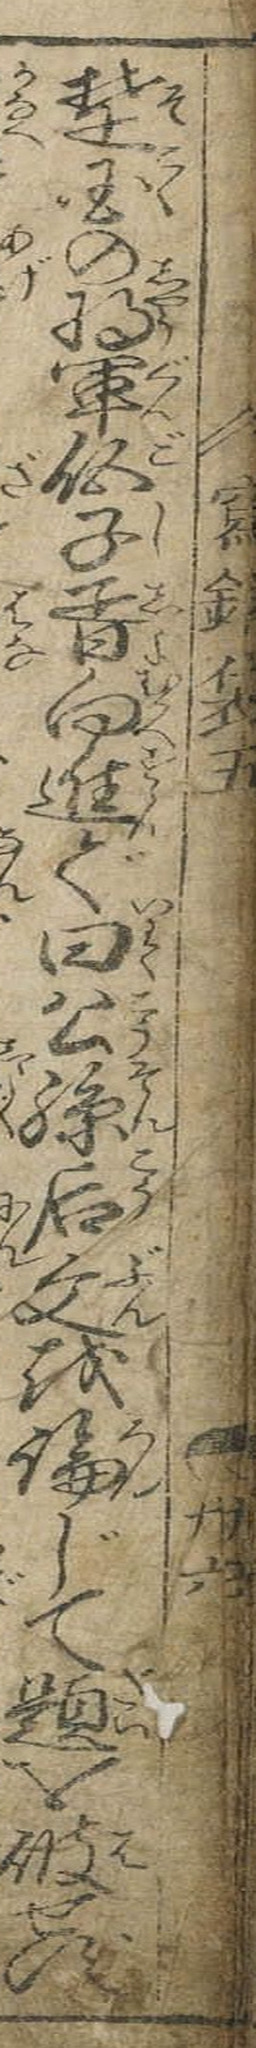楚国の将軍伍子胥向進で曰公孫后文を論じて題を破せず
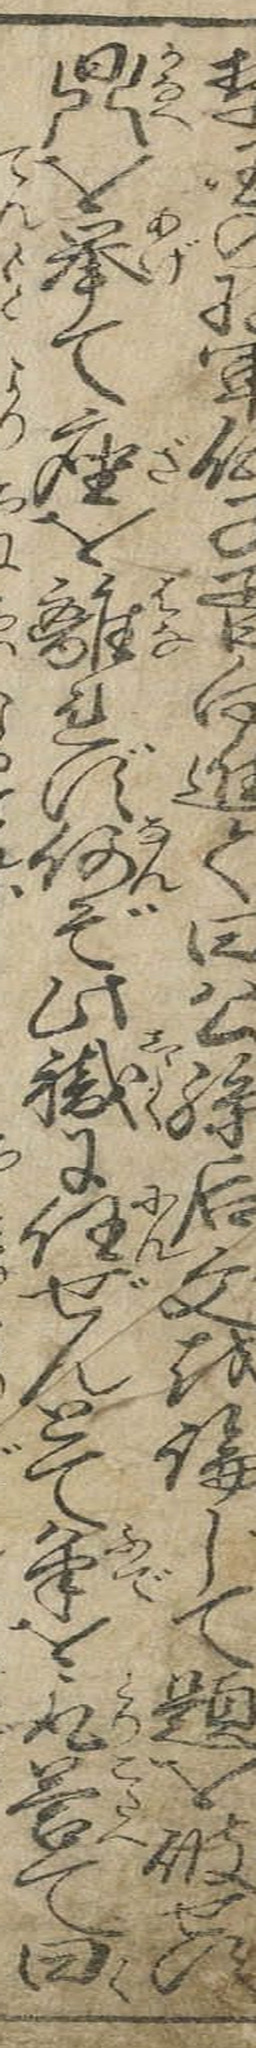鼎を挙て座を離れず何ぞ此職に任ぜんとて筆を取答て曰く
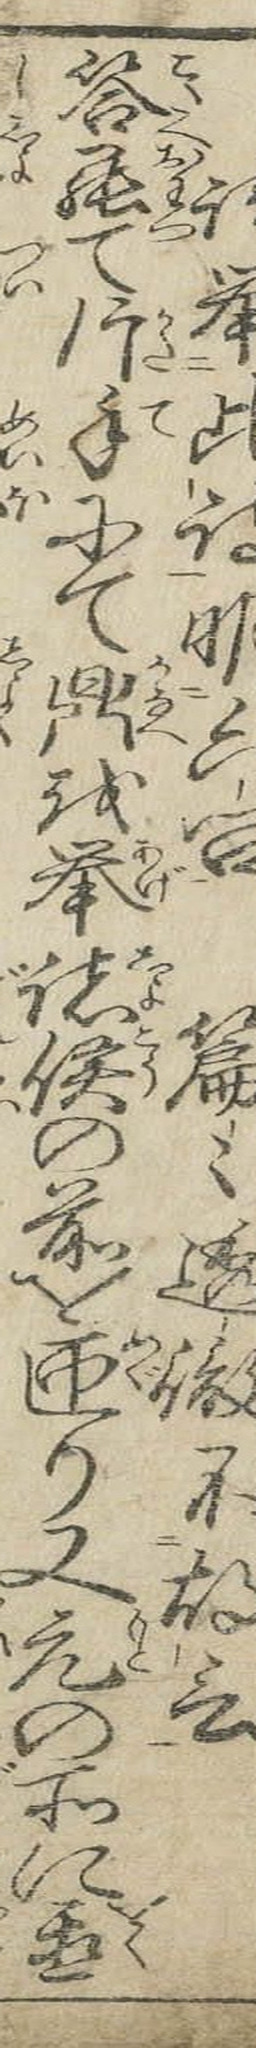答罷て片手にて鼎を挙諸侯の前を匝り又元の所に置
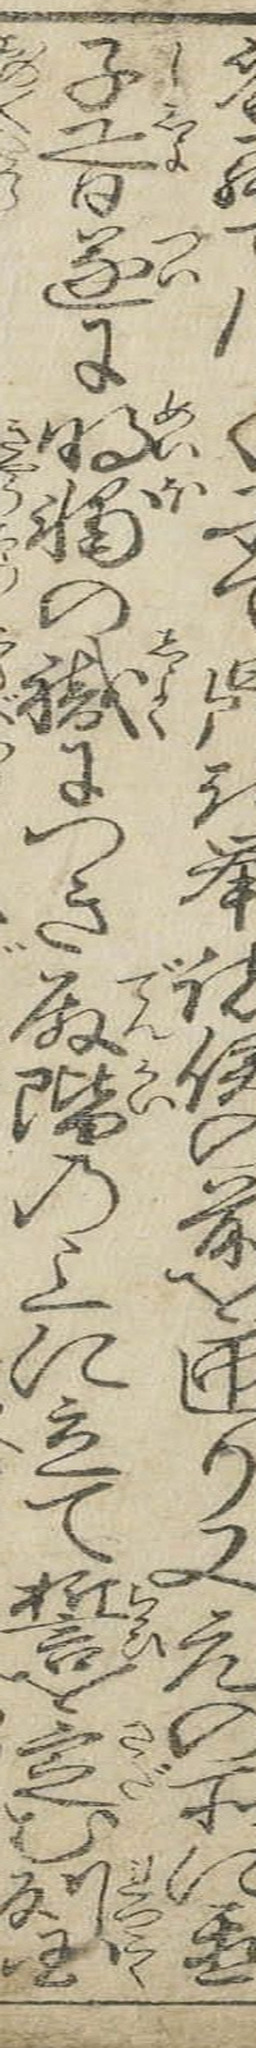子胥遂に明輔の職につき殿階の上に立て誓を定む列国
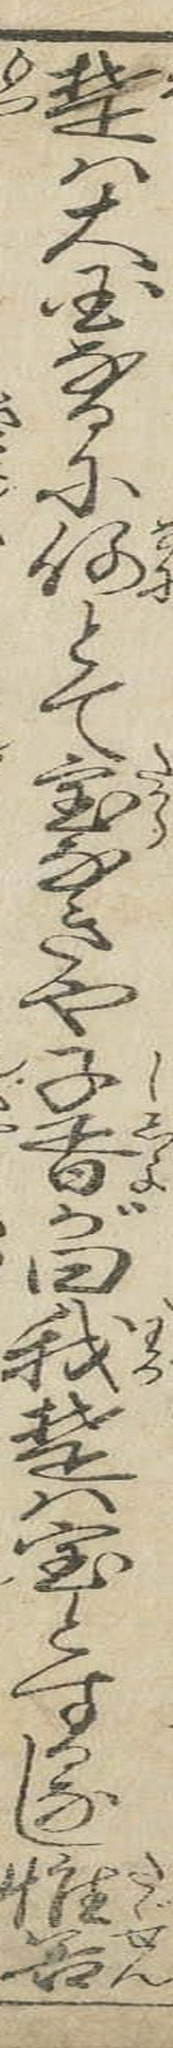楚は大国なるに何とて宝なきや子胥が曰我楚は宝とするなし惟善
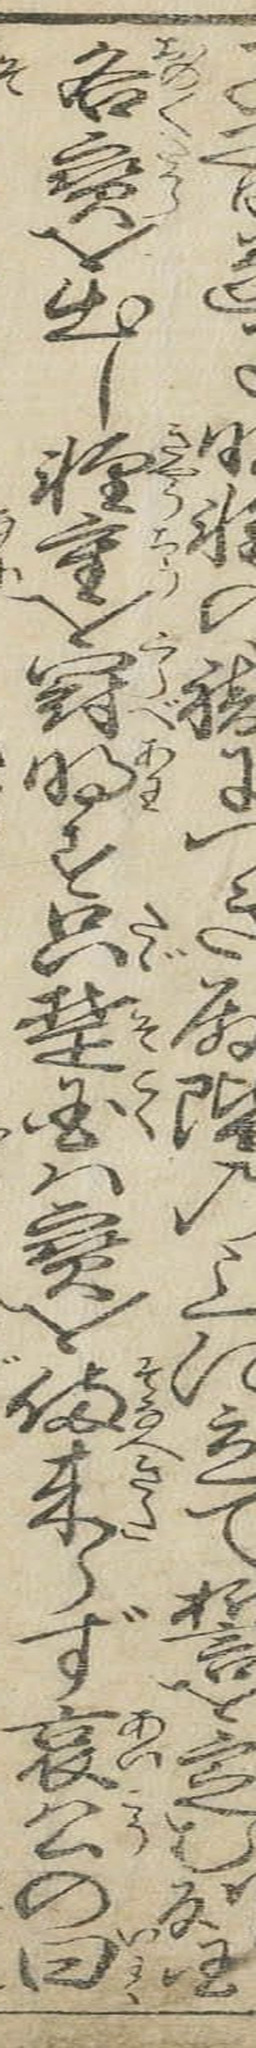各宝を出し軽重を闘明す只楚国は宝を備来らず哀公の曰
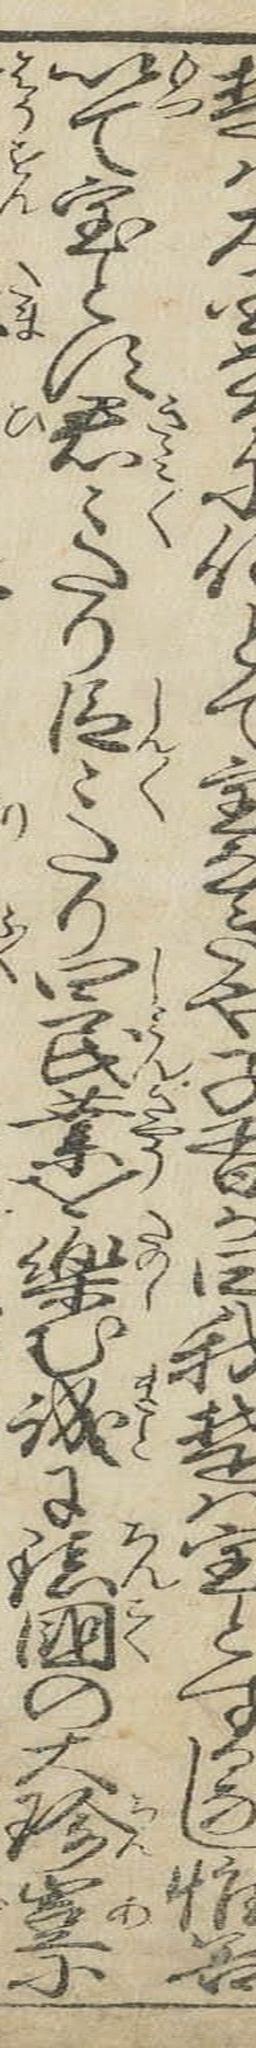以て宝とす君々たり臣々たり四民業を楽む誠に鎮国の大珍豈に
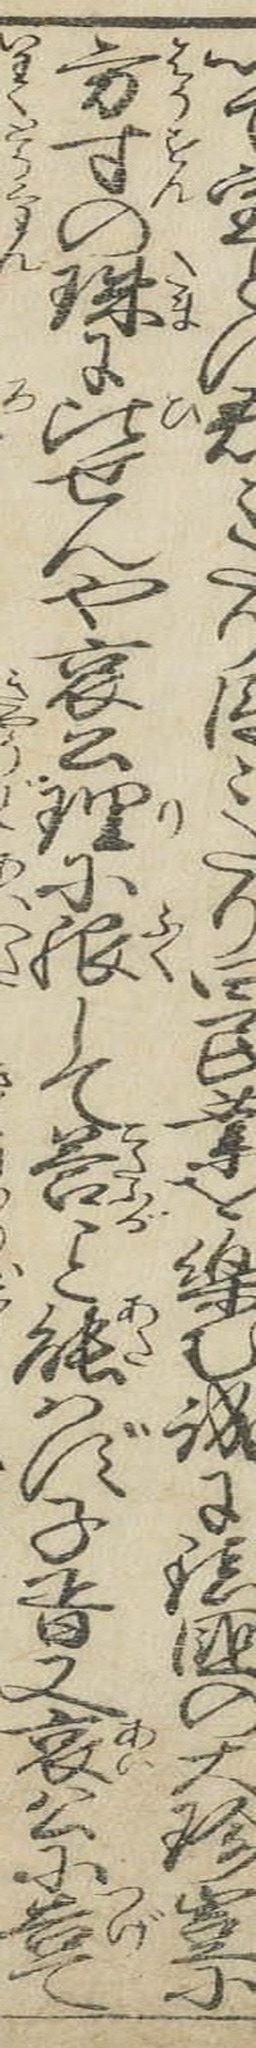方寸の珠に比せんや哀公理に服して答こと能はず子胥又哀公に告て
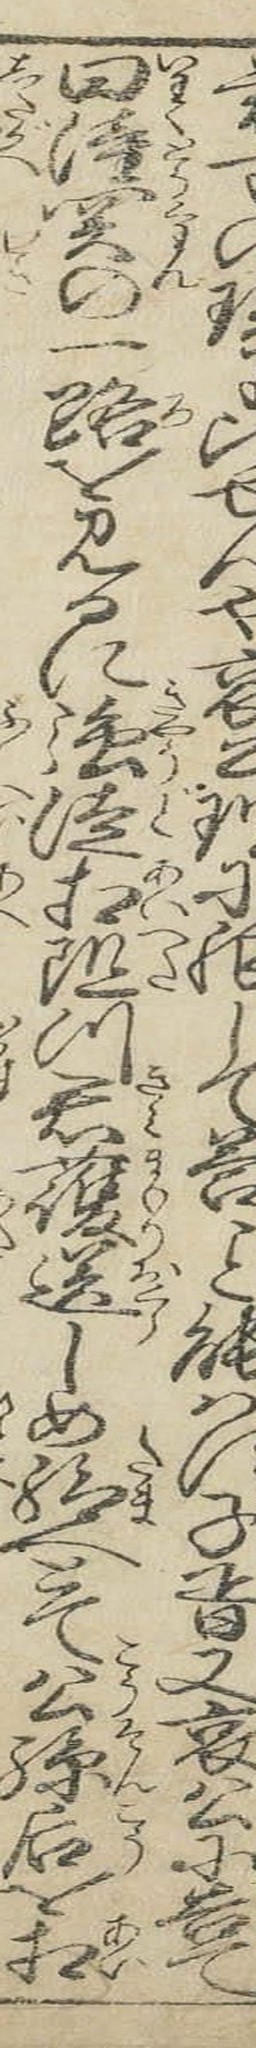曰潼関の一路を見るに強徒相阻つ君護送しめ給へとて公孫后を相
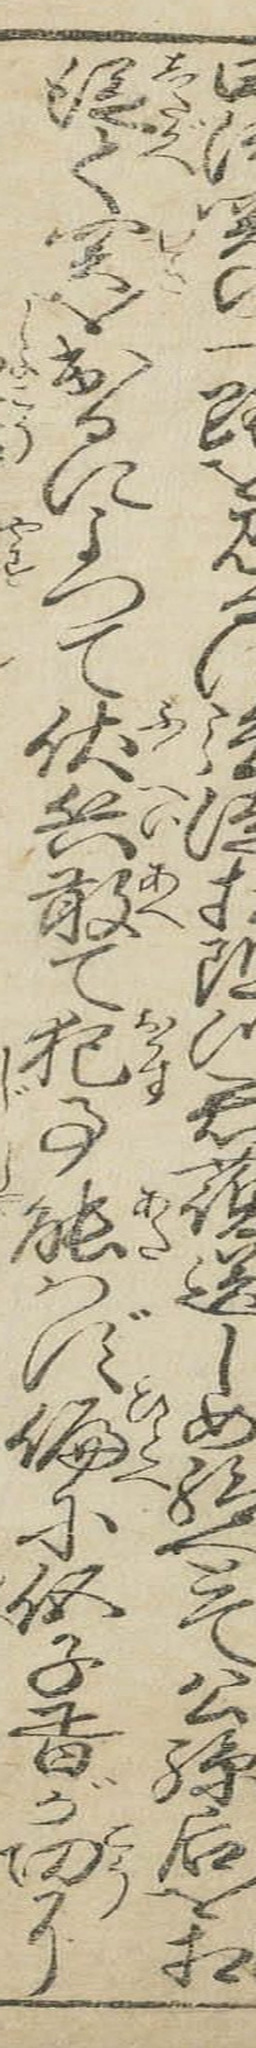従て関を出るによつて伏兵敢て犯事能はず偏に伍子胥が功に
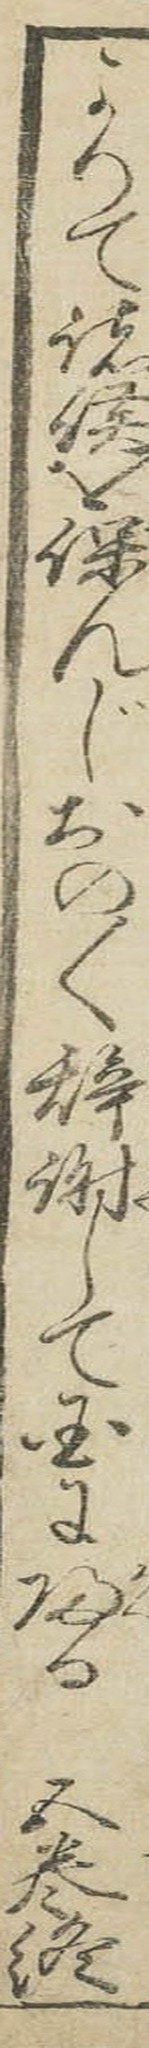よりて諸侯を保んじおの〳〵辞謝して国に帰る五巻終
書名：絵本写宝袋 9巻 5之巻
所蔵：東京学芸大学教育コンテンツアーカイブ
